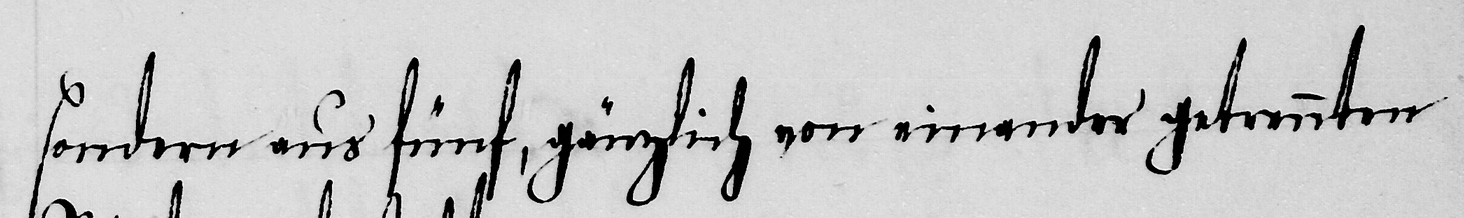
sondern aus fünf, gänzlich von einander getrennten
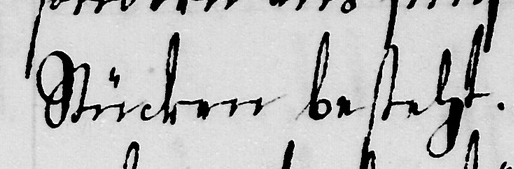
Stücken besteht.
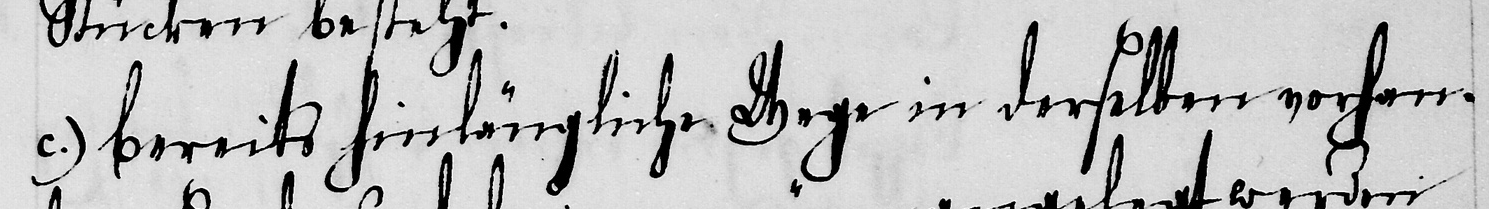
c.) Bereits hinlängliche Wege in derselben vorhan¬
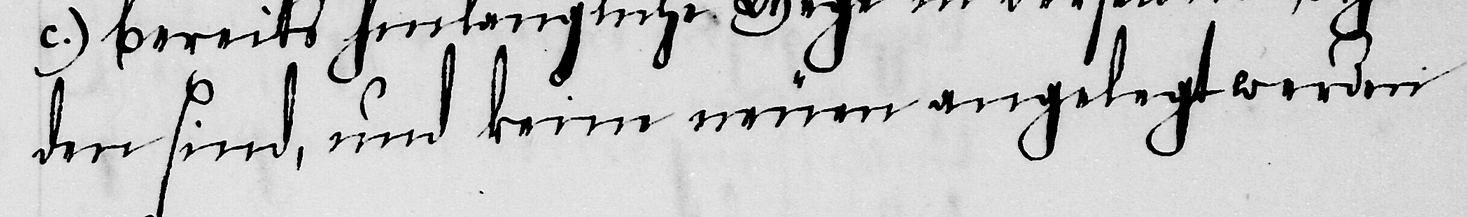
den sind, und keine neuen angelegt werden
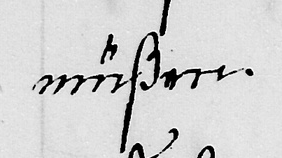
müßen.
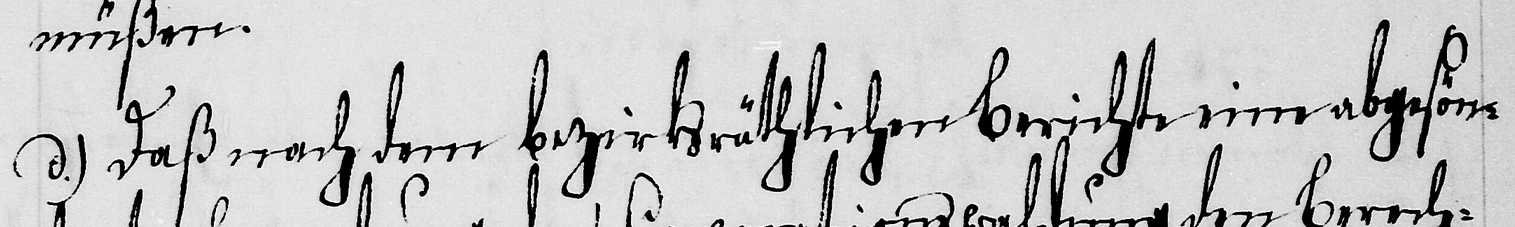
d.) Daß nach dem bezirksräthlichen Berichte eine abgesön¬
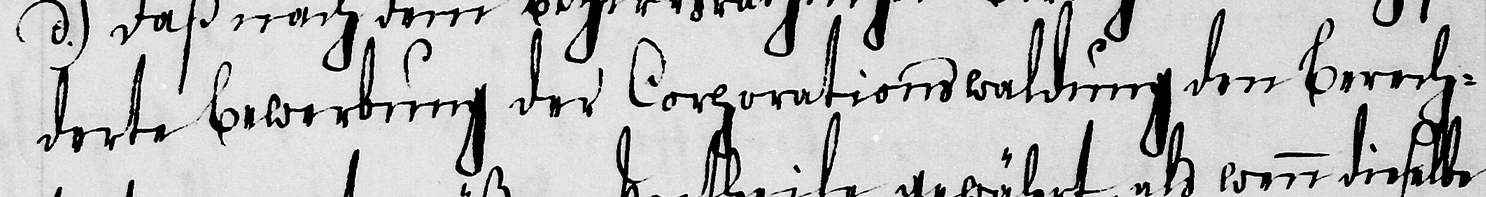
derte Bewerbung der Corporationswaldung den Berech¬
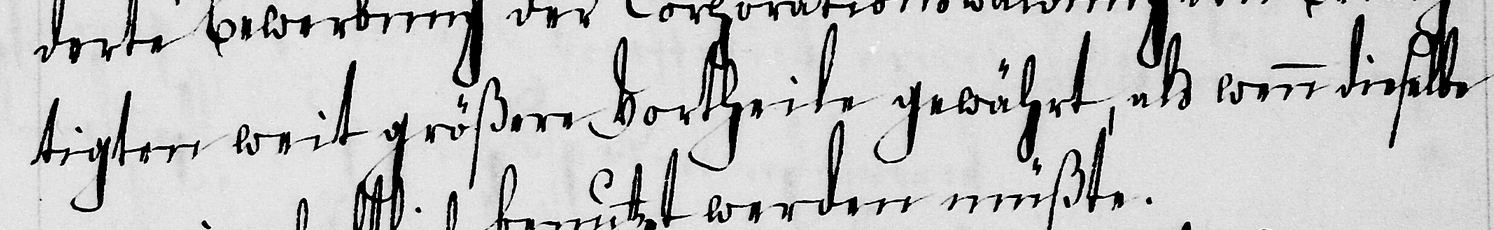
tigten weit größere Vortheile gewährt, als wenn dieselbe
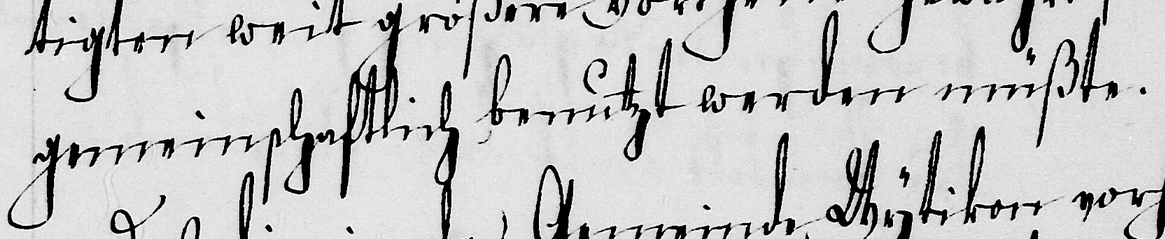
gemeinschaftlich benutzt werden müßte.
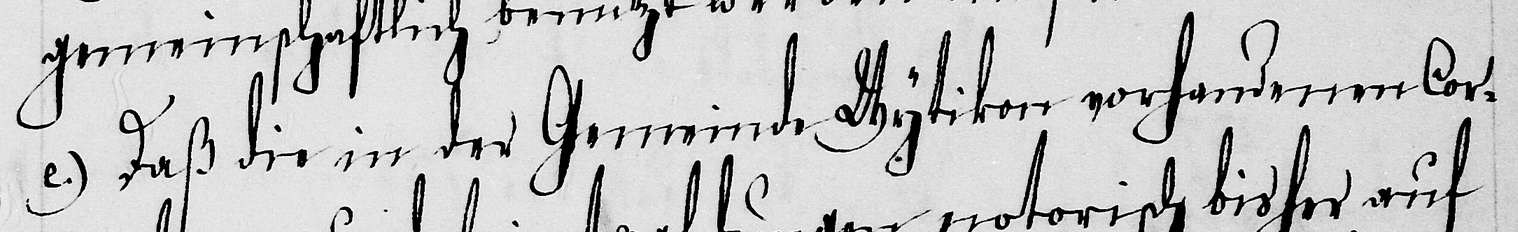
e.) Daß die in der Gemeinde Wytikon vorhandenen Cor¬
